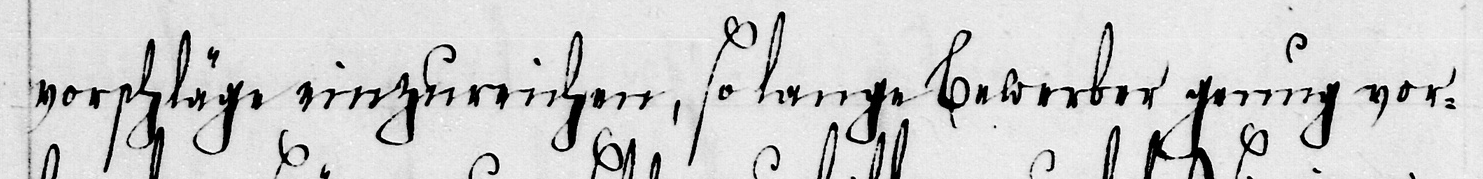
vorschläge einzureichen, so lange Bewerber genug vor¬
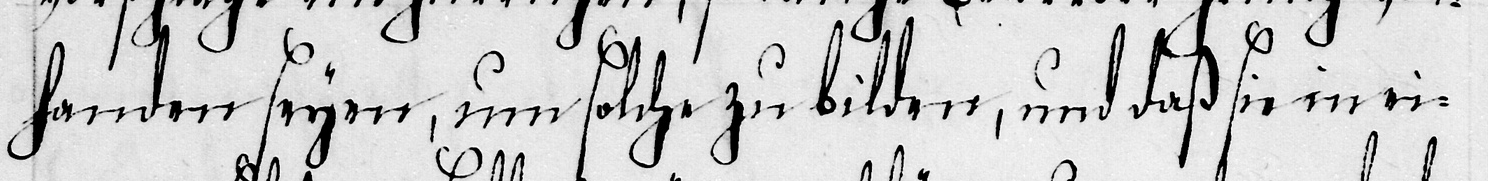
handen seyen, um solche zu bilden, und daß sie in e¬
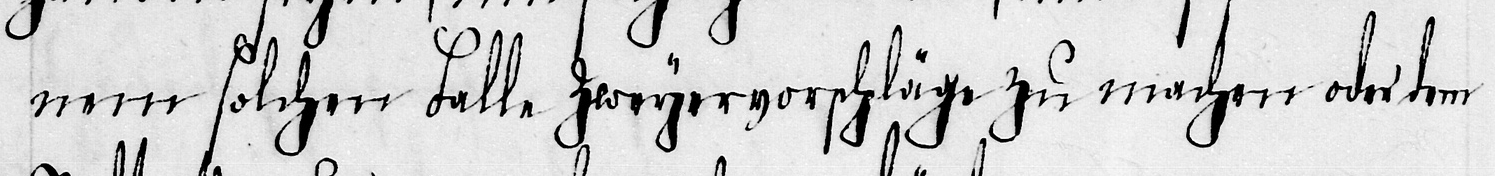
inem solchen Falle Zweyervorschläge zu machen oder dem
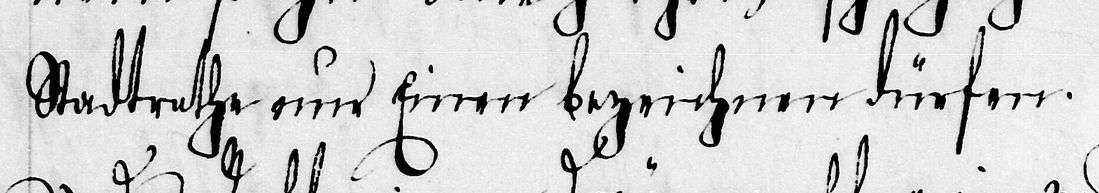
Stadtrathe nur Einen bezeichnen dürfen.
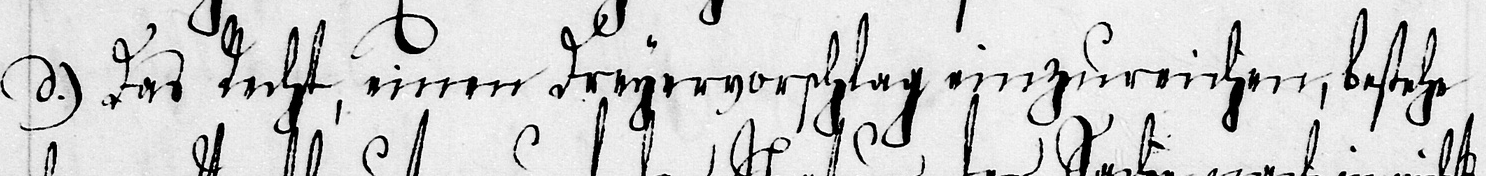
d.) Das Recht, einen Dreyervorschlag einzureichen, bestehe
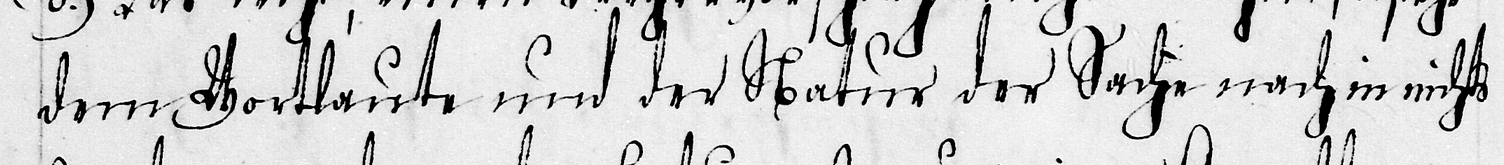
dem Wortlaute und der Natur der Sache nach in nich¬
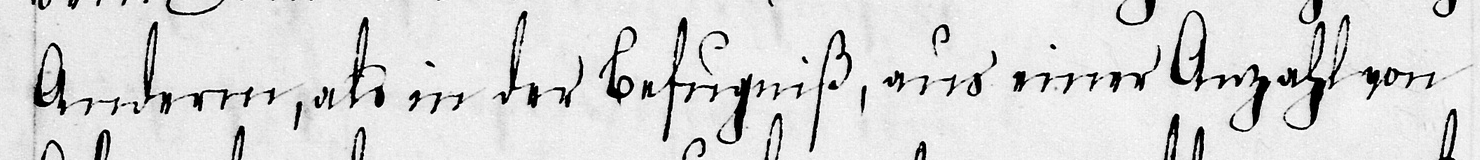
Anderm, als in der Befugniß, aus einer Anzahl von
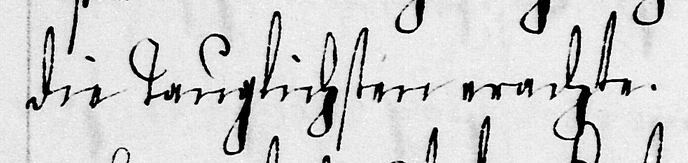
die Tauglichsten erachte.
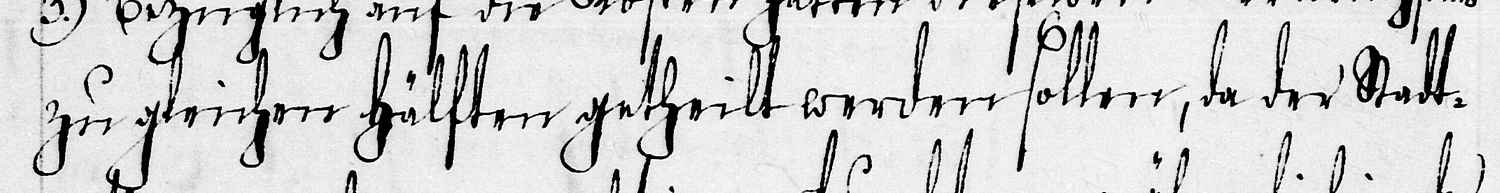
zu gleichen Hälften getheilt werden sollen, da der Stad¬
